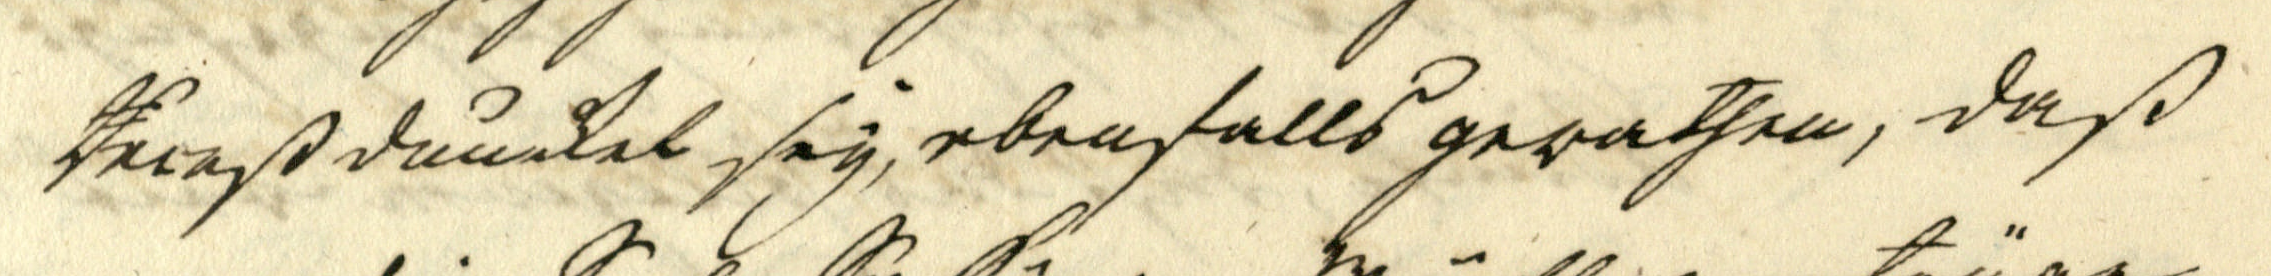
Receß dunckel seÿ, ebenfalls gerathen, daß
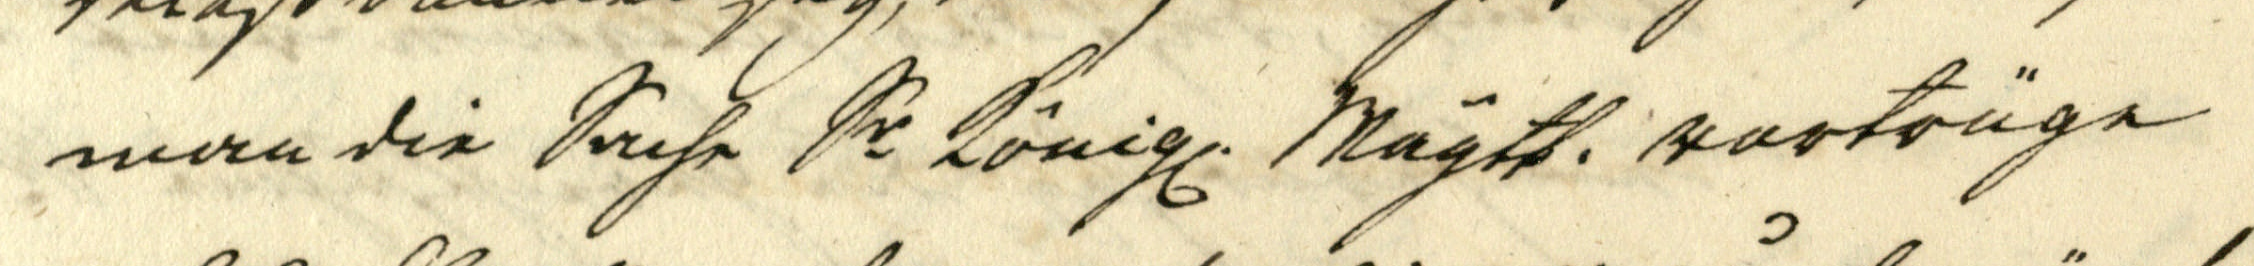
man die Sache Sr Königl. Maÿtt. vortrüge
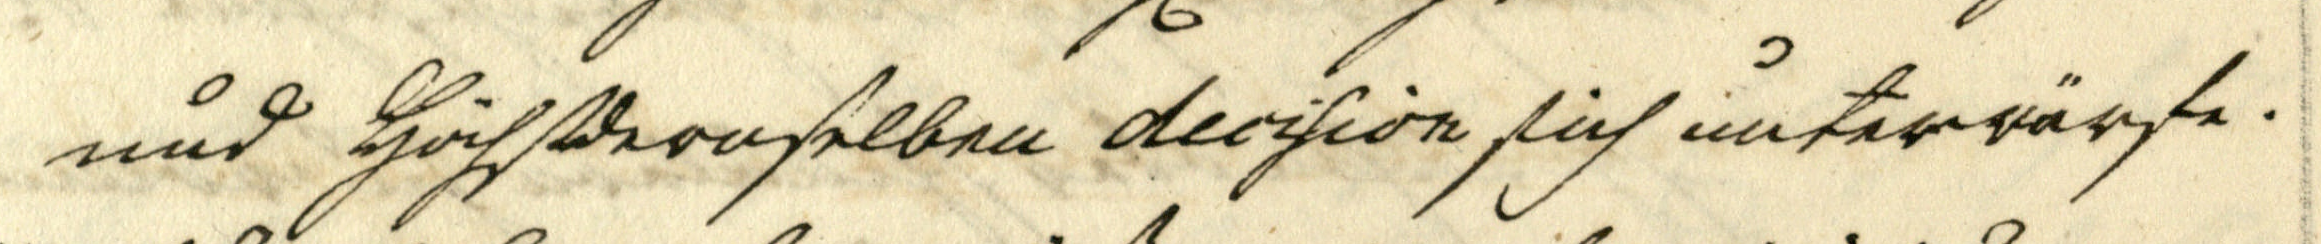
und Höchstderoselben decision sich unterwürfe.
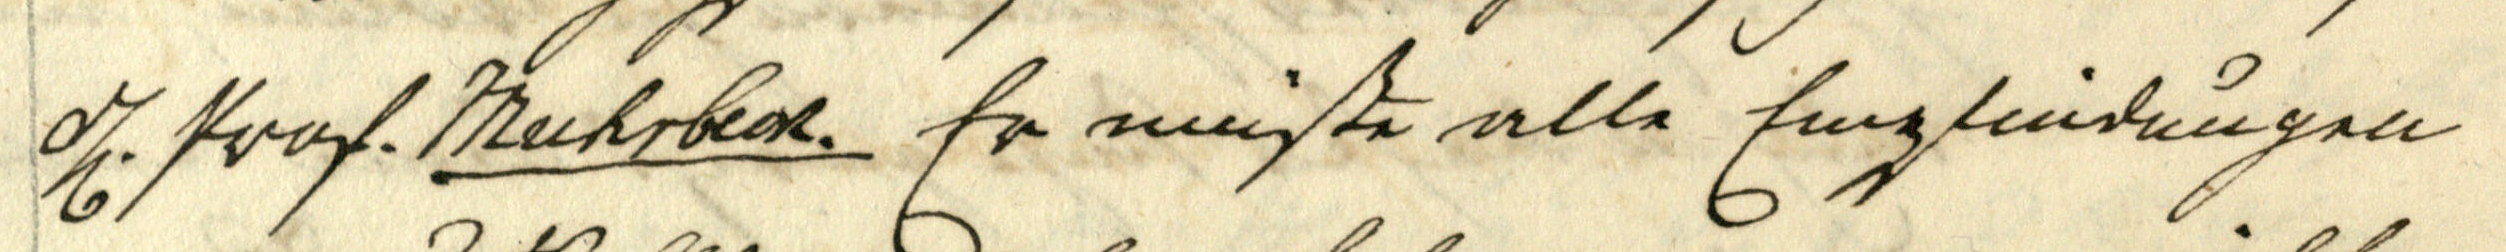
dh. Prof. Muhrbeck. Er müßte alle Empfindungen
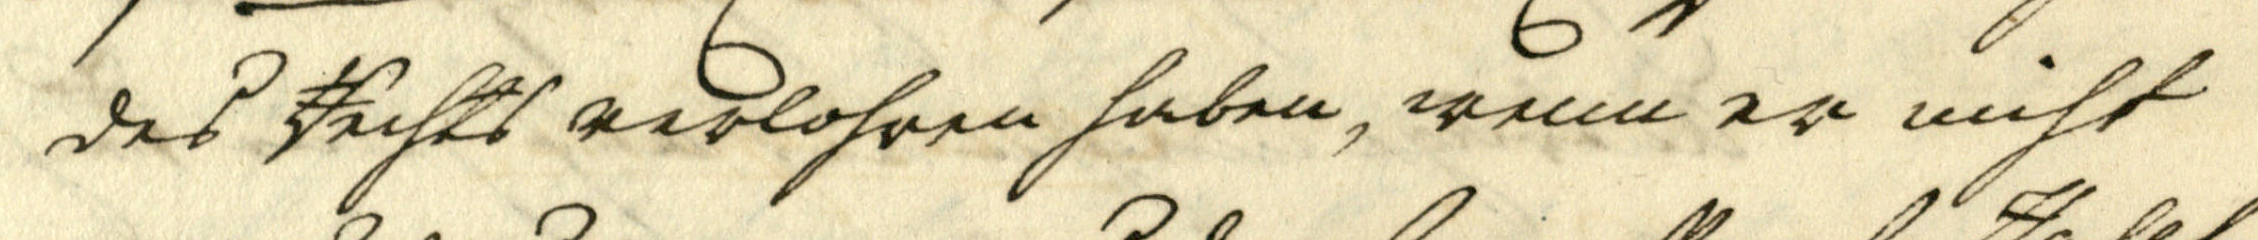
des Rechts verlohren haben, wenn er nicht
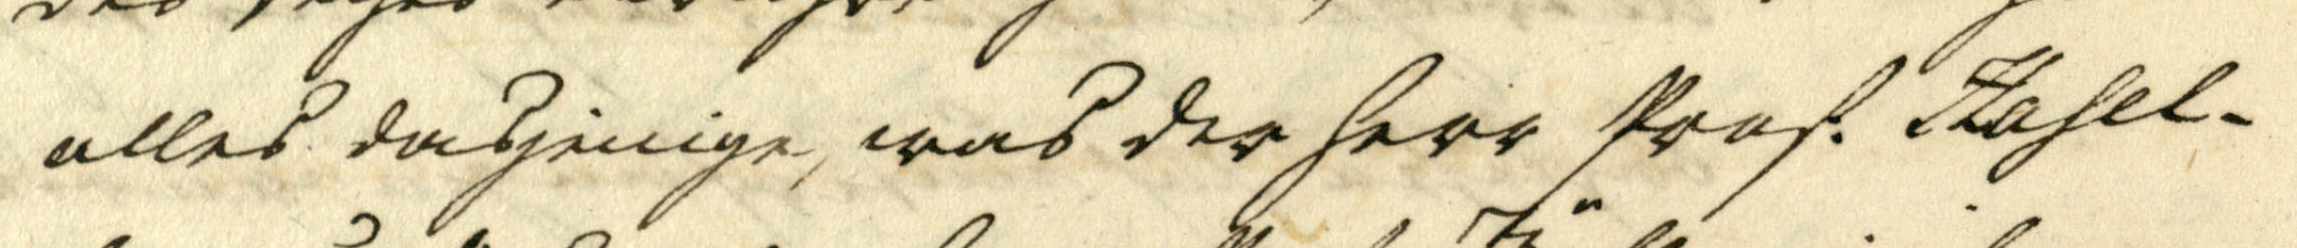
alles dasjenige, was der Herr Prof. Hasel¬
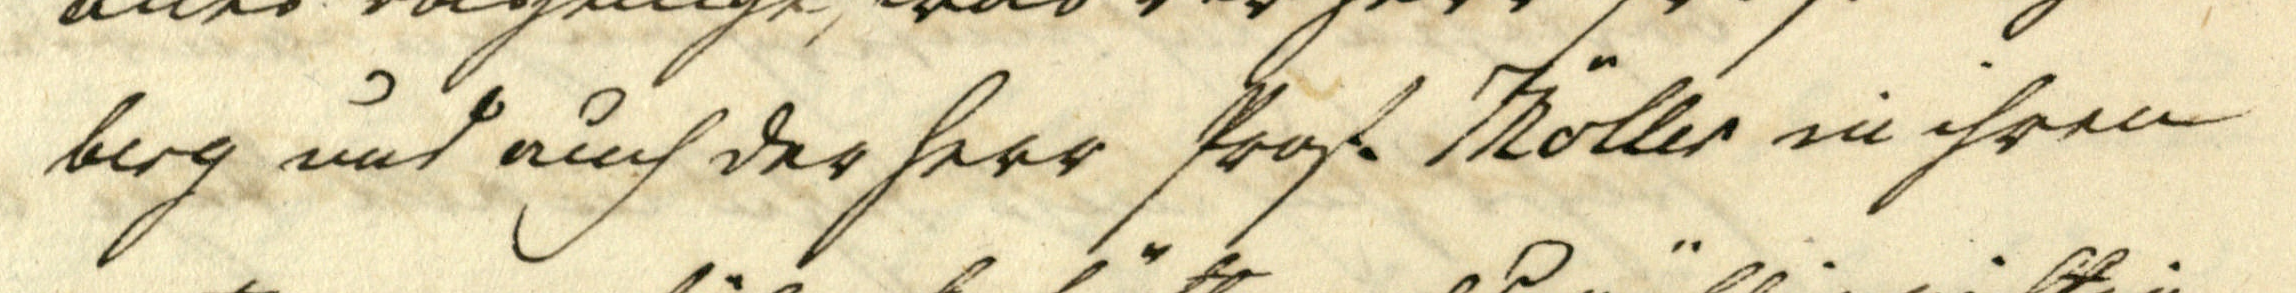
berg und auch der Herr Prof. Möller in ihren
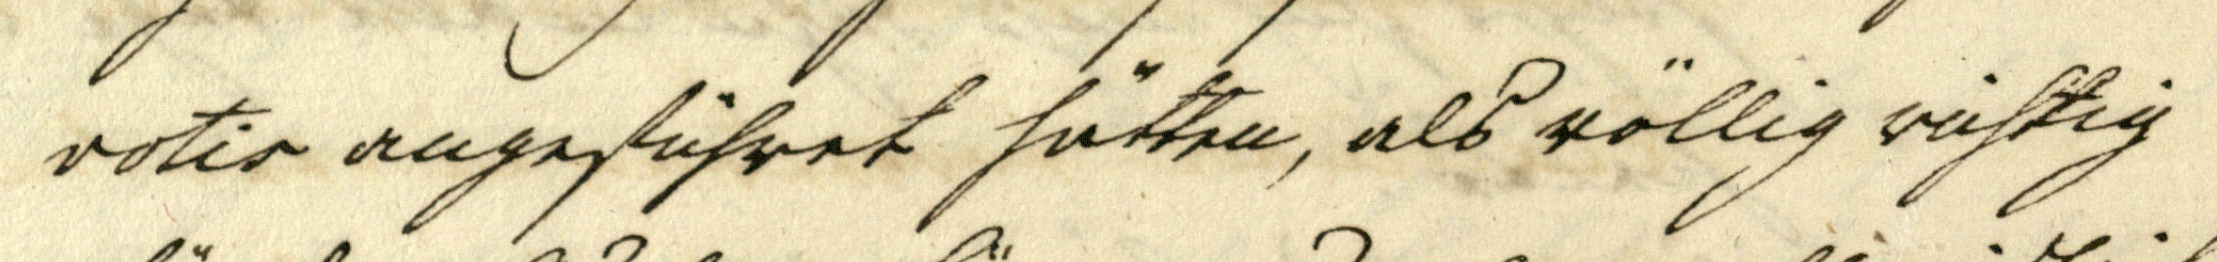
votis angeführet hätten, als völlig richtig
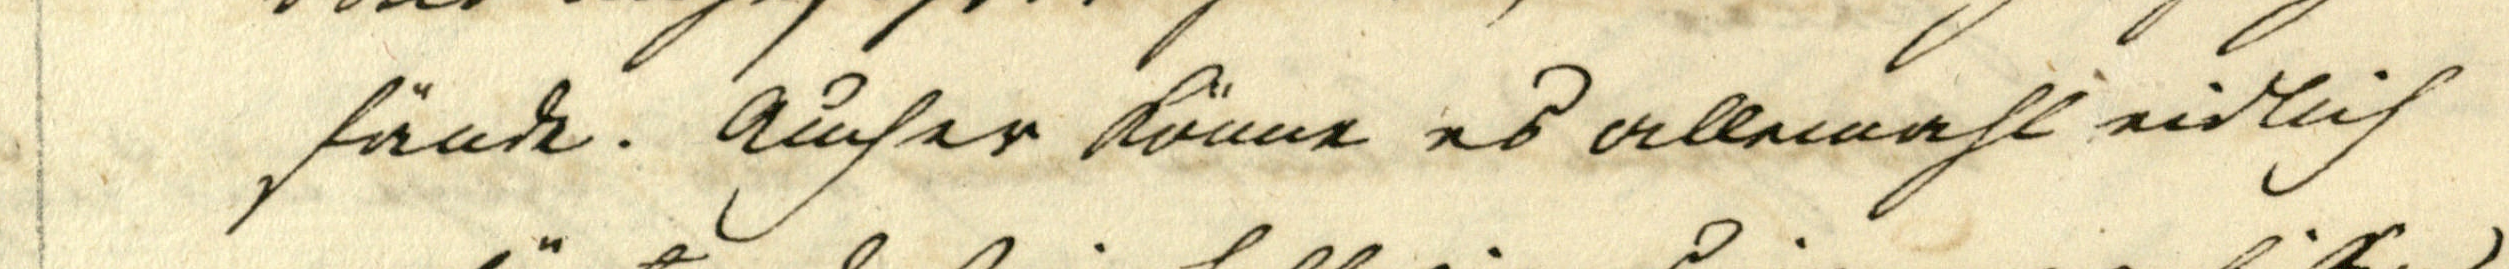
fände. Auch er könne es allemahl eidlich
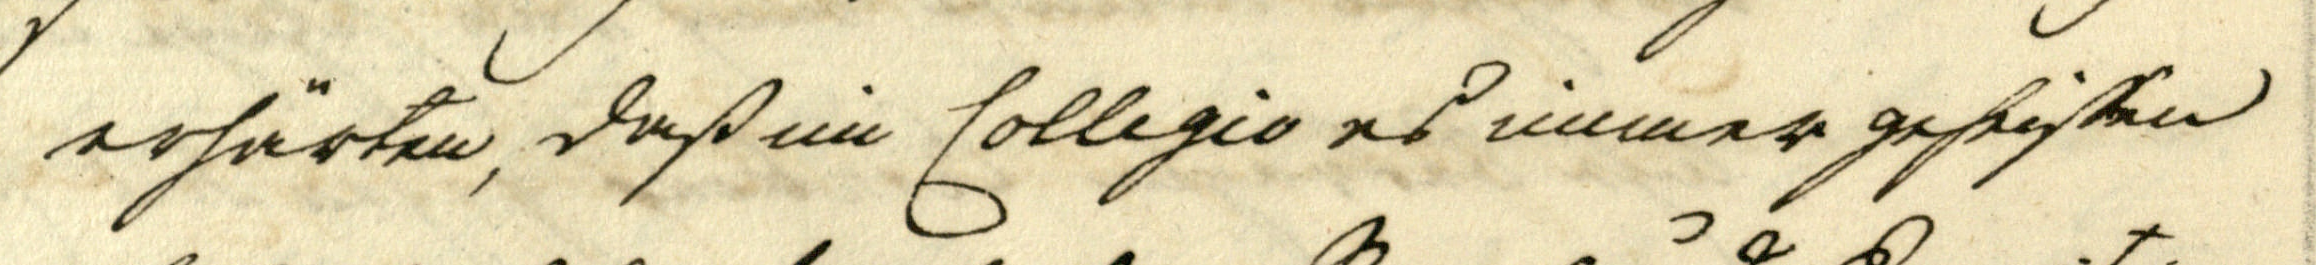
erhärten, daß im Collegio es immer geheissen
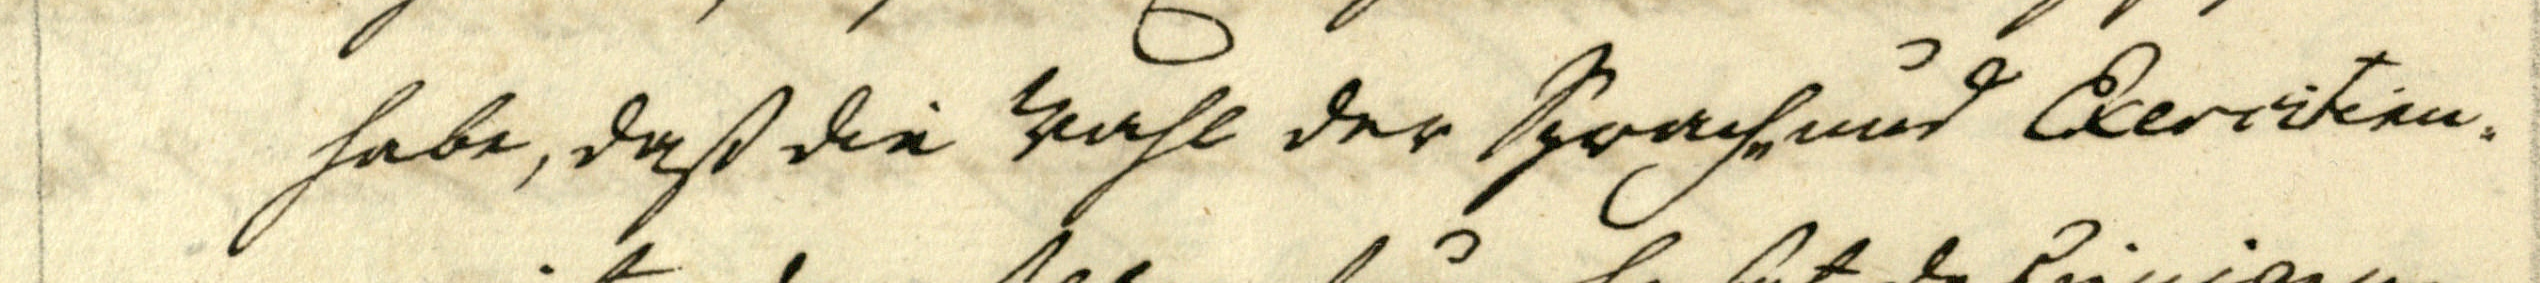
habe, daß die Wahl der Sprach- und Exercitien¬
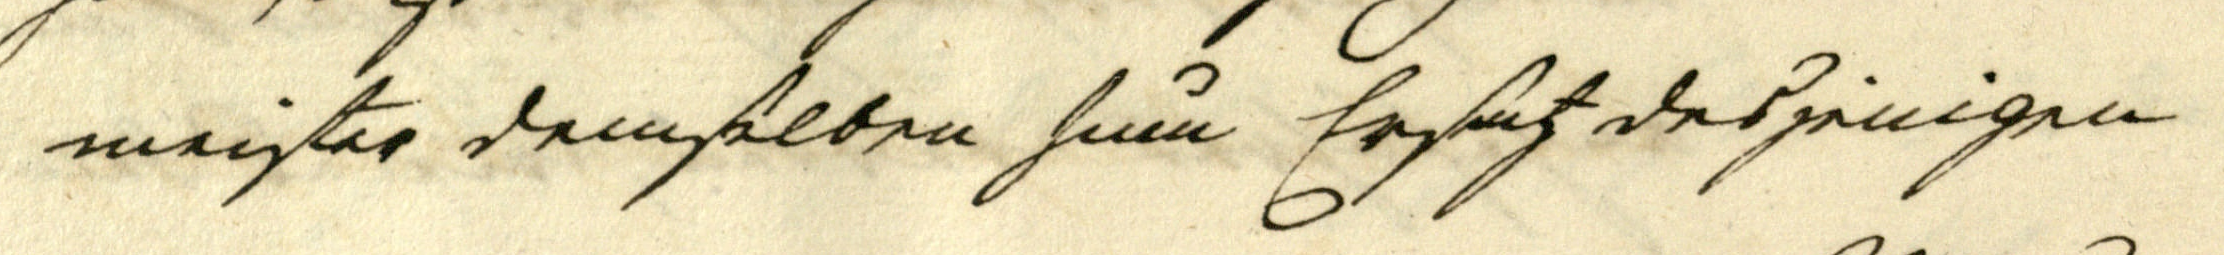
meister demselben zum Ersatz desjenigen
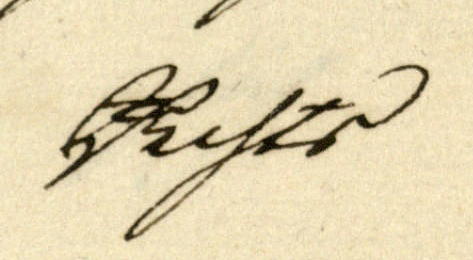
Rechts
